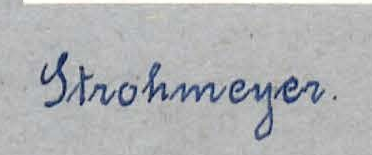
Strohmeyer
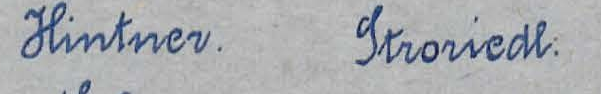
Hintner Stroriedl
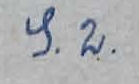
S. 2.
